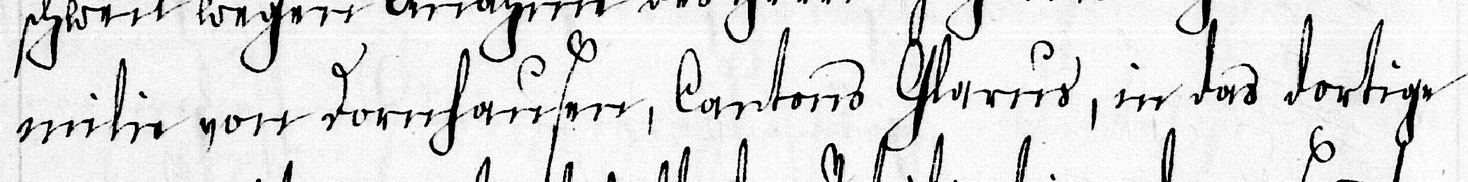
milie von Dornhausen, Cantons Glarus, in das dortige
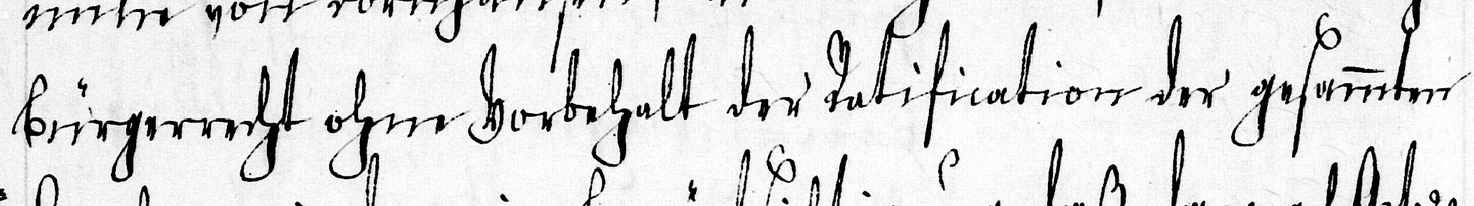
Bürgerrecht ohne Vorbehalt der Ratification der gesammten
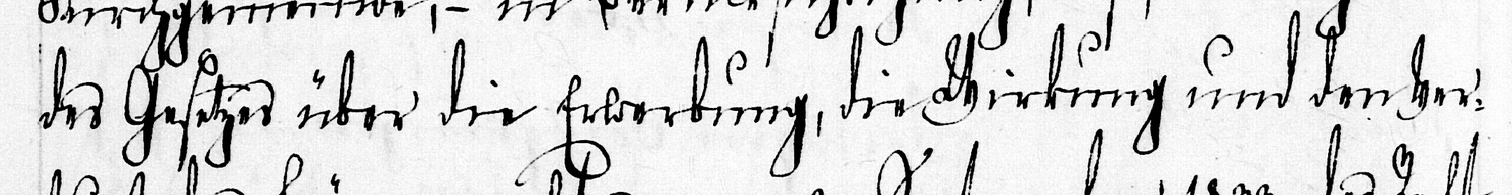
des Gesetzes über die Erwerbung, die Wirkung und den Ver¬
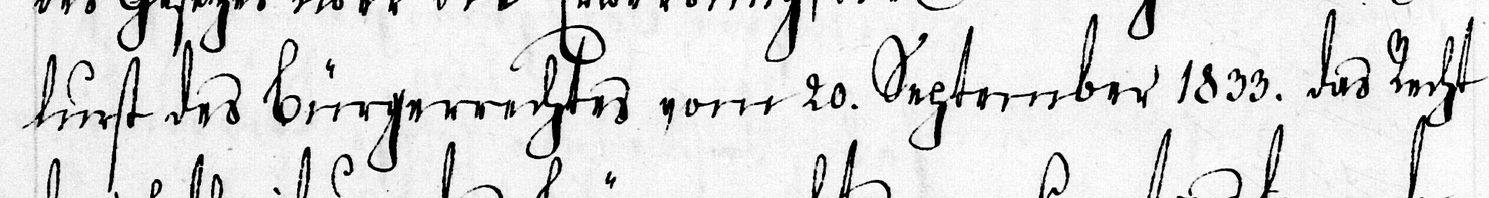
lust des Bürgerrechtes vom 20. September 1833. das Recht
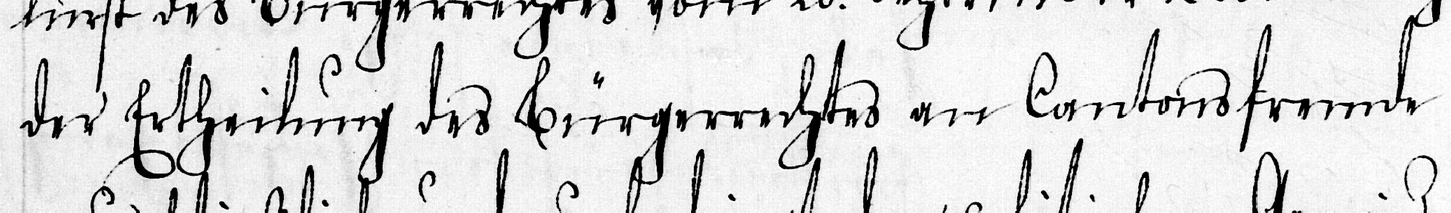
der Ertheilung des Bürgerrechtes an Cantonsfremde
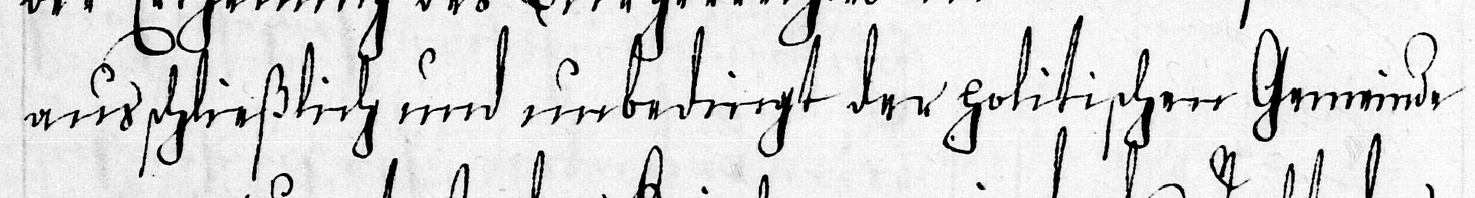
ausschließlich und unbedingt der politischen Gemeinde
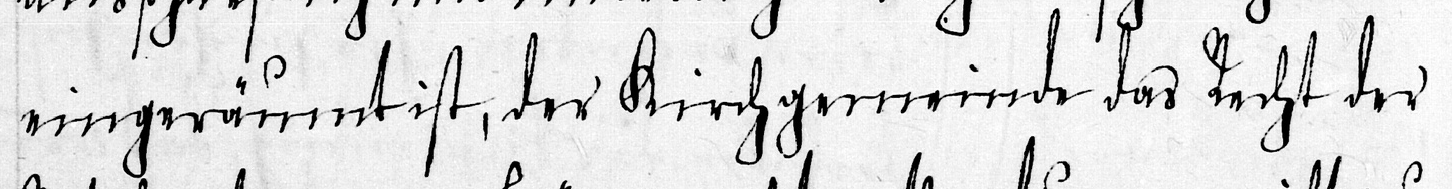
eingeräumt ist, der Kirchgemeinde das Recht der
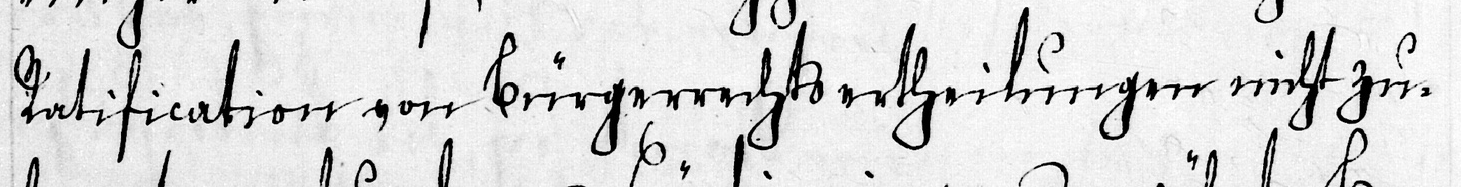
Ratification von Bürgerrechtsertheilungen nicht zu¬
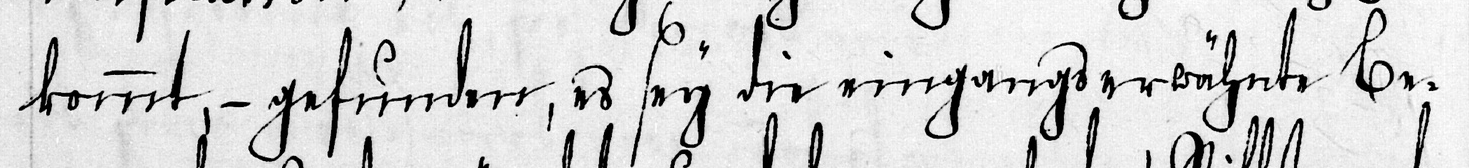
kommt, – gefunden, es sey die eingangserwähnte Be¬
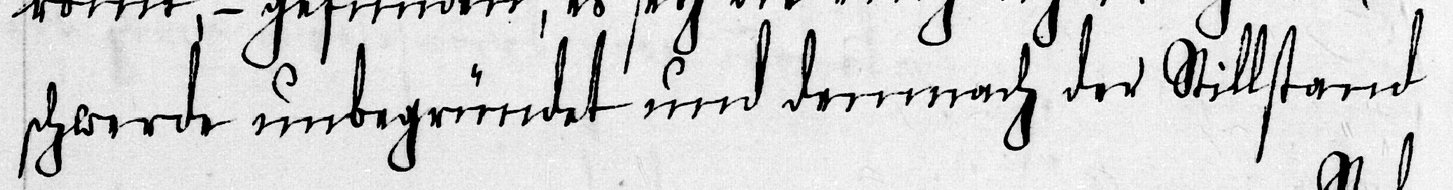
schwerde unbegründet und demnach der Stillstand
